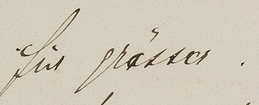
für grösser.
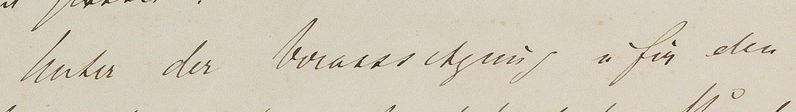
Unter der Voraussetzung u für den
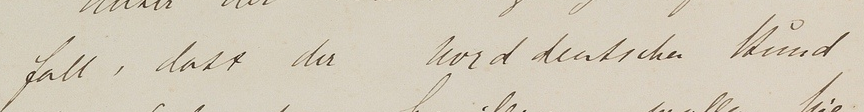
Fall, dass der norddeutsche Bund
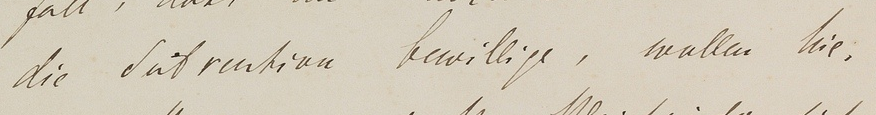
die Subvention bewillige, wollen hie-
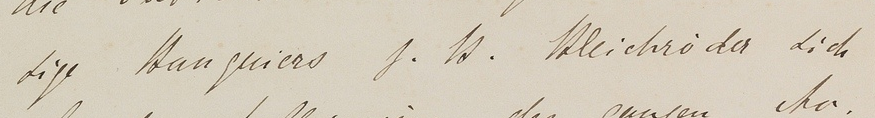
sige Banquiers z. B. Bleichröder sich
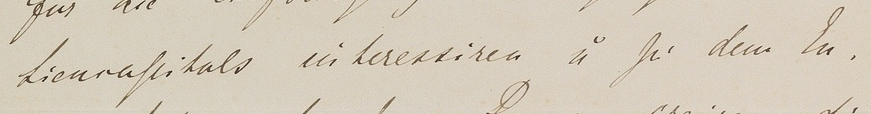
tiencapitals interessiren u zu dem En-
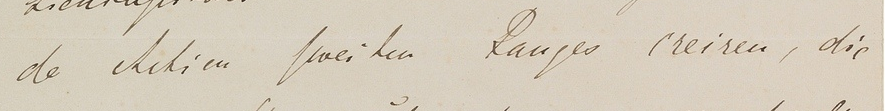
de Actien zweiten Ranges creiren, die
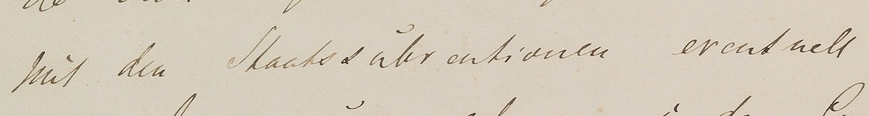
mit den Staatssubventionen eventuell
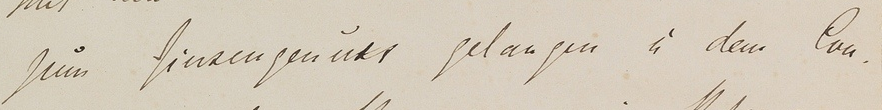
zum Zinsengenuss gelangen u dem Con-
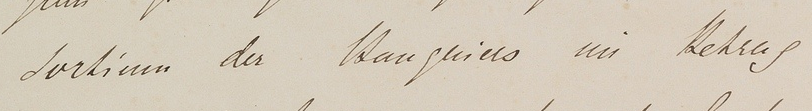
sortium der Banquiers im Betrag
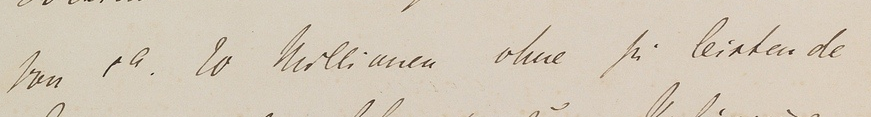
von ca 20 Millionen ohne zu leistende
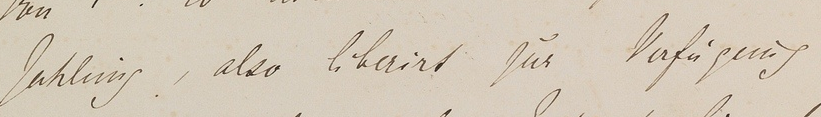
Zahlung, also liberirt zur Verfügung
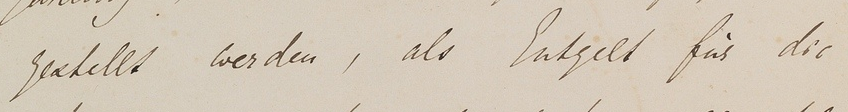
gestellt werden, als Entgelt für die
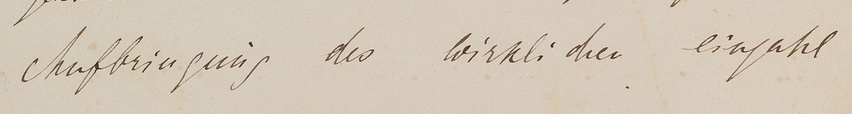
Aufbringung des wirklichen einzahl-
